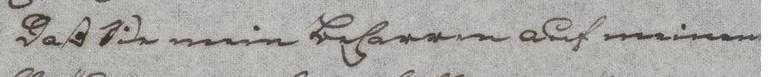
Daß Sie mein Beharren auf meinem
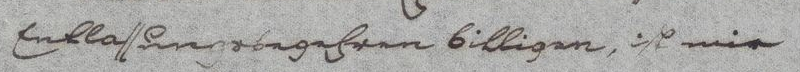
Entlassungsbegehren billigen, ist mir
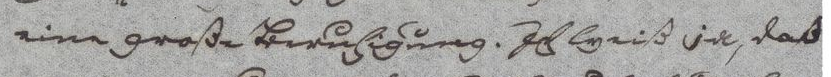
eine große Beruhigung. Ich weiß ja, daß
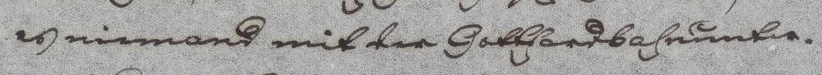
es niemand mit der Gotthardbahnunter-
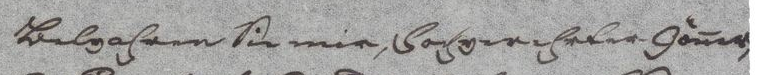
Bewahren Sie mir, hochverehrter Gönner,
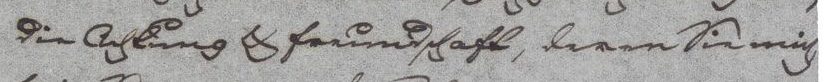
die Achtung & Freundschaft, deren Sie mich,
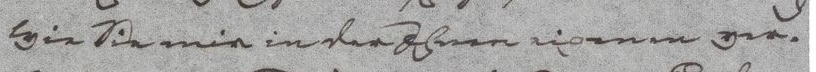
wie Sie mir in der Ihnen eigenen ver-
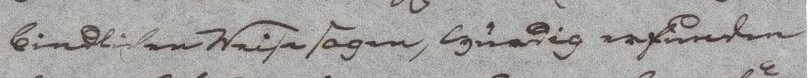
bindlichen Weise sagen, würdig erfunden
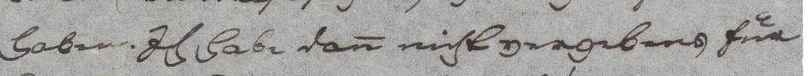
haben. Ich habe dann nicht vergebens für
